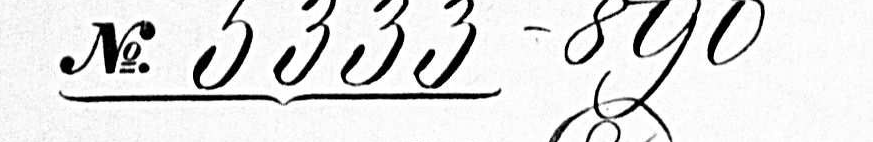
No. 5333 - 890
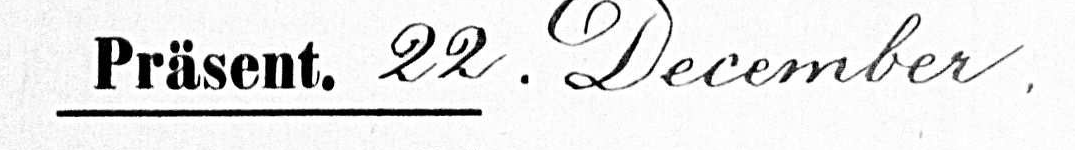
Präsent. 22. December.
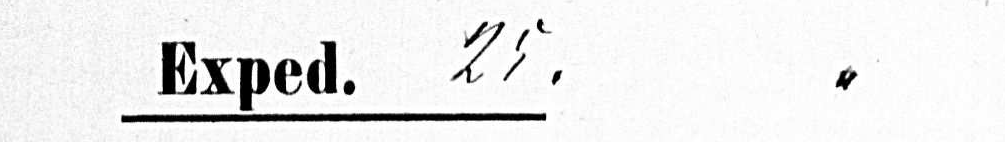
Exped. 25. December.
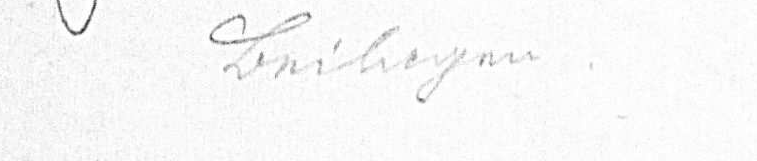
Beilagen.
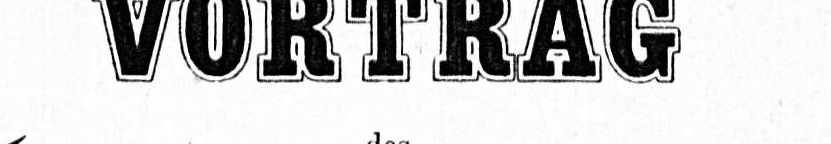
Vortrag
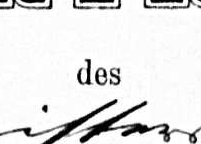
des
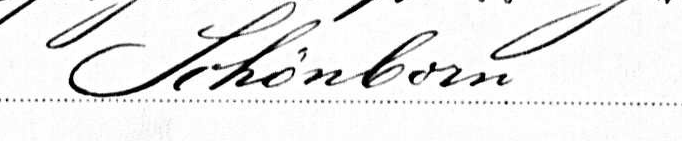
Schöborn
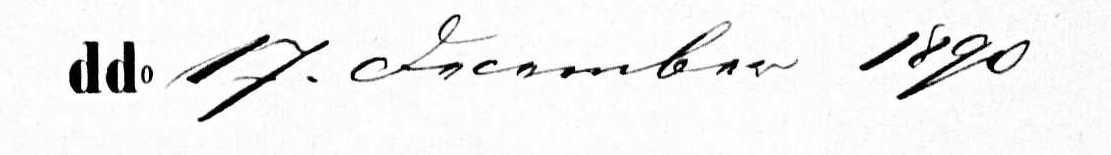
ddo 17. December 1890
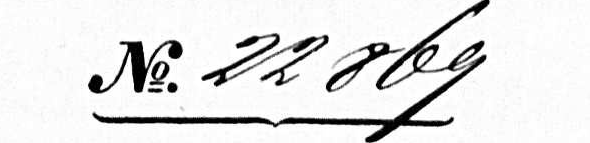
No. 22869
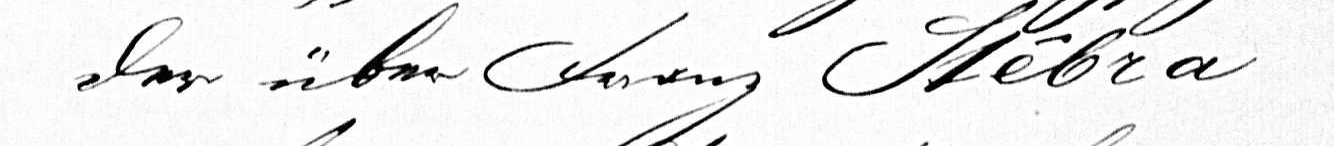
der über Franz Stebra
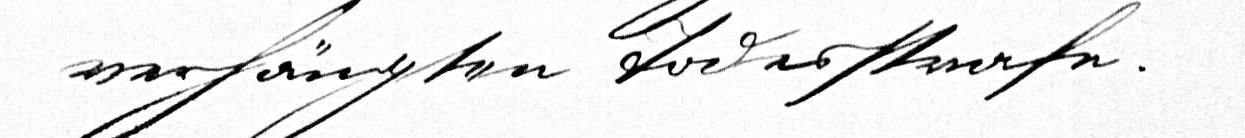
verhängten Todesstrafe.
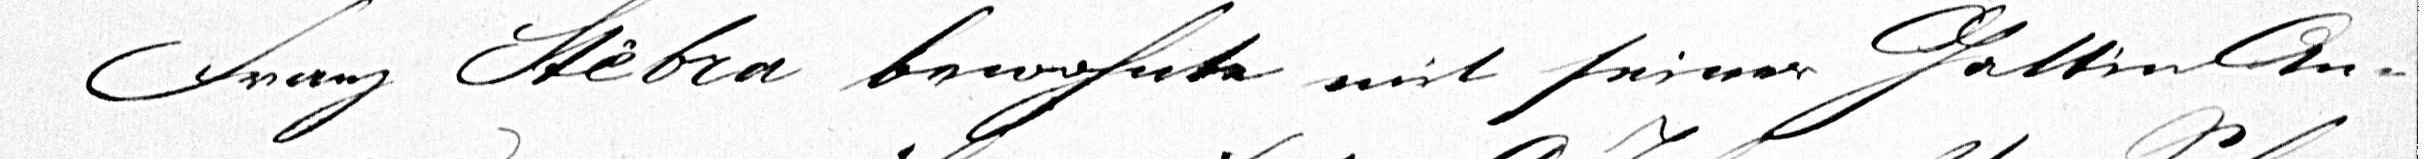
Franz Stebra bewohnte mit seiner Gattin An¬
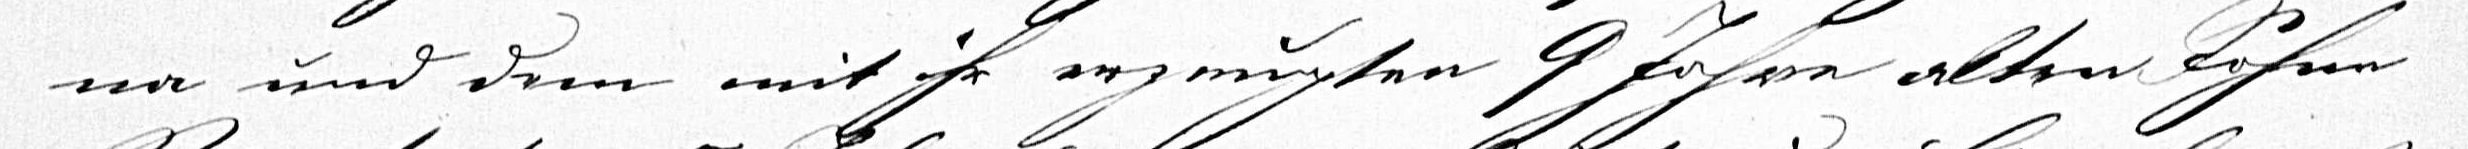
na und dem mit ihr erzeugten 9 Jahre alten Sohne
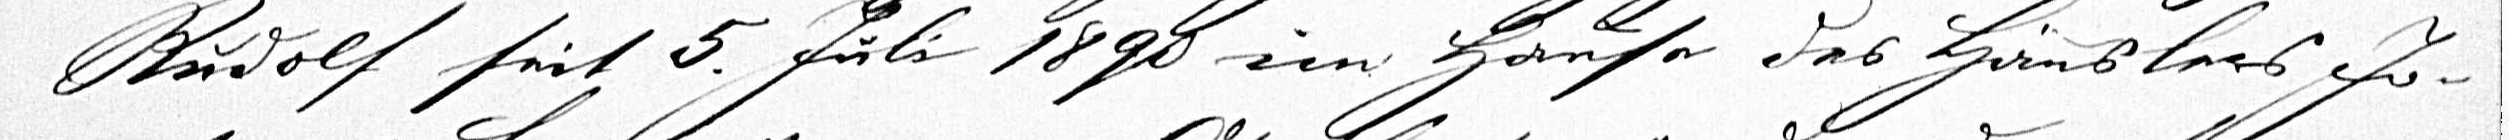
Rudolf seit 5. Juli 1890 im Hause des Häuslers Jo¬
